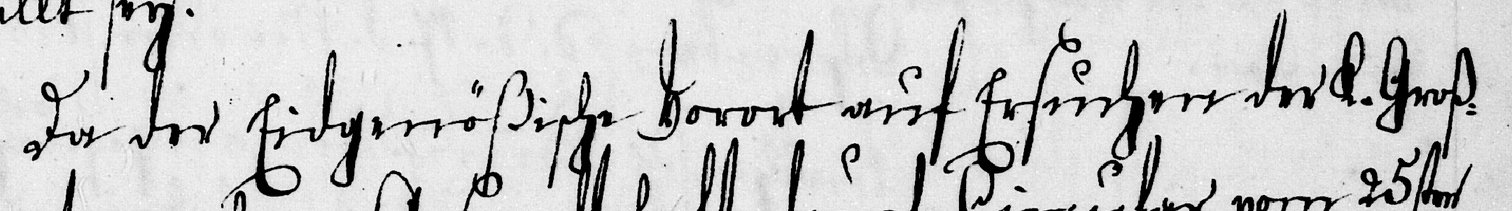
Da der Eidgenößische Vorort auf Ersuchen der K. Groß¬
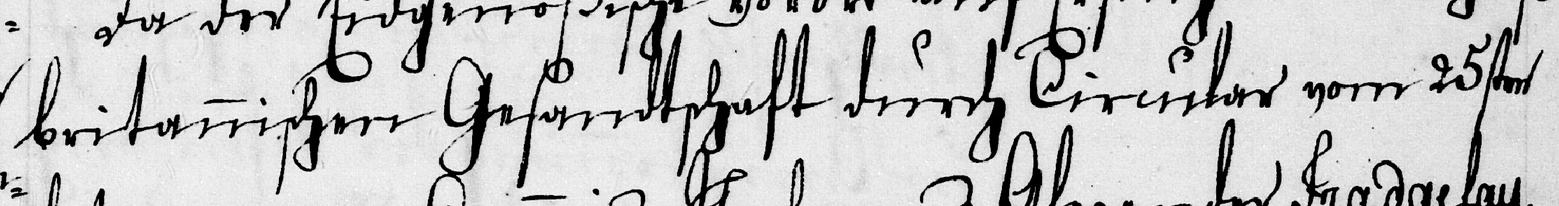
britannischen Gesandtschaft durch Circular vom 25ten
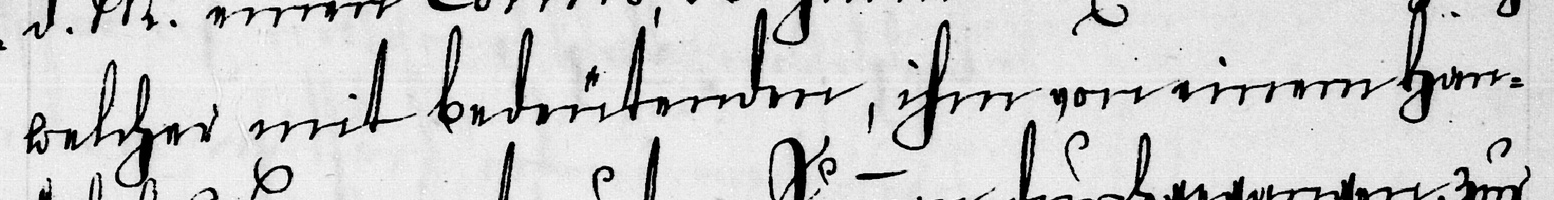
welcher mit bedeutenden, ihm von einem Han¬
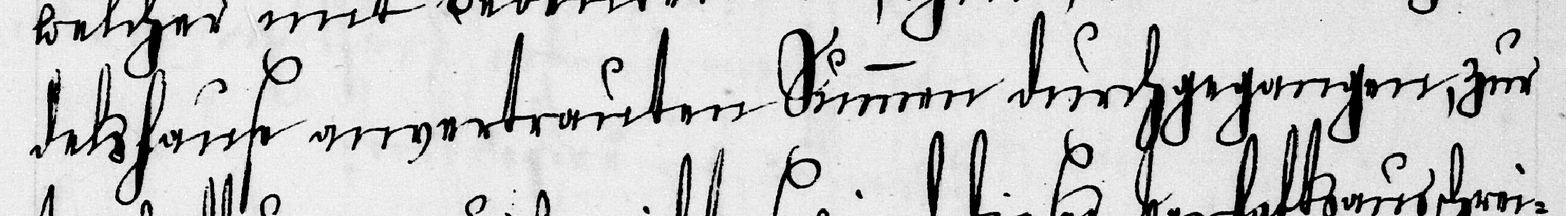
delshause anvertrauten Summe durchgegangen, zur
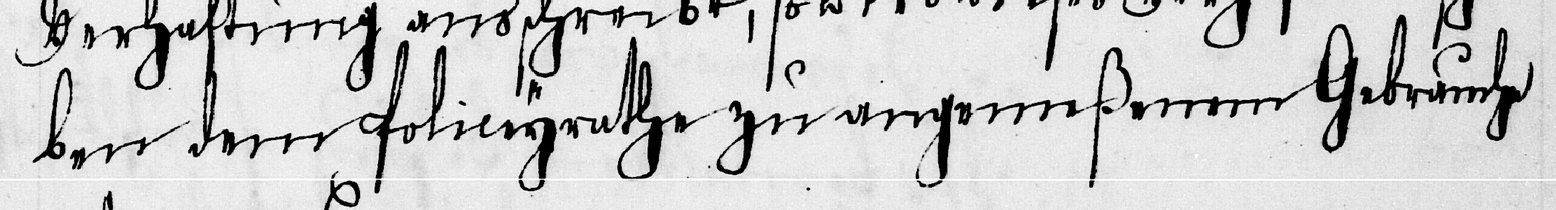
ben dem Policeyrathe zu angemeßenem Gebrauche
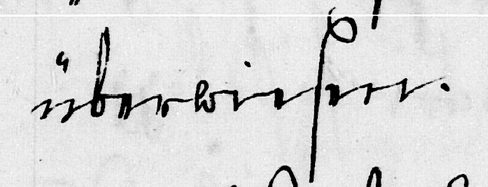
überwiesen.
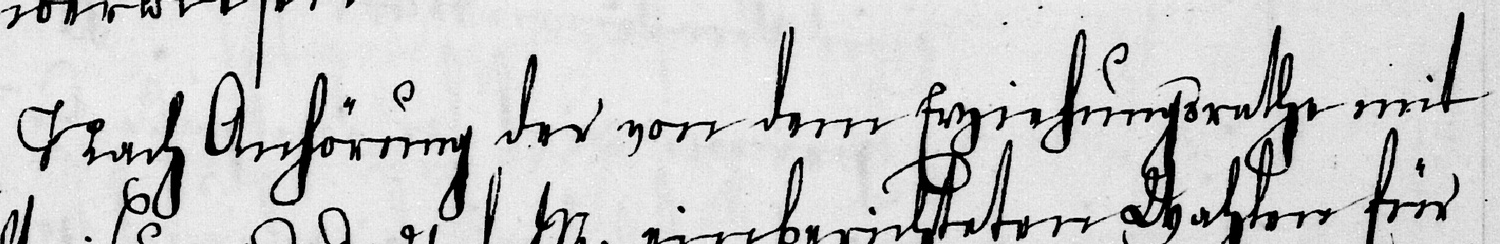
Nach Anhörung der von dem Erziehungsrathe mit
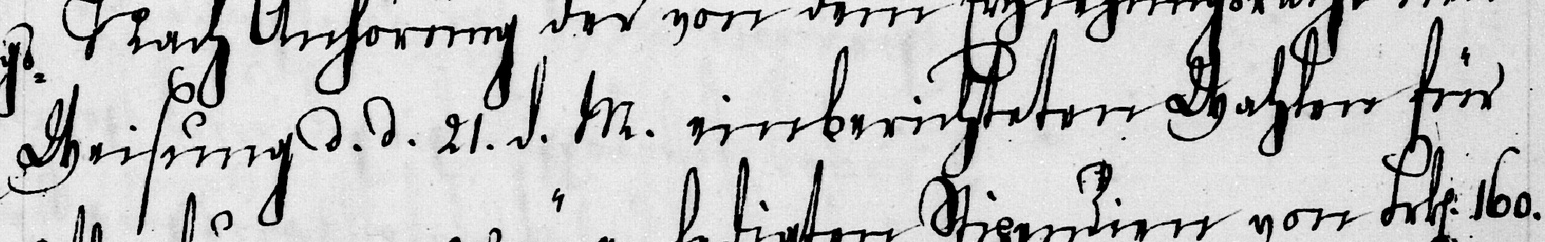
Weisung d. d. 21. d. M. einberichteten Wahlen für
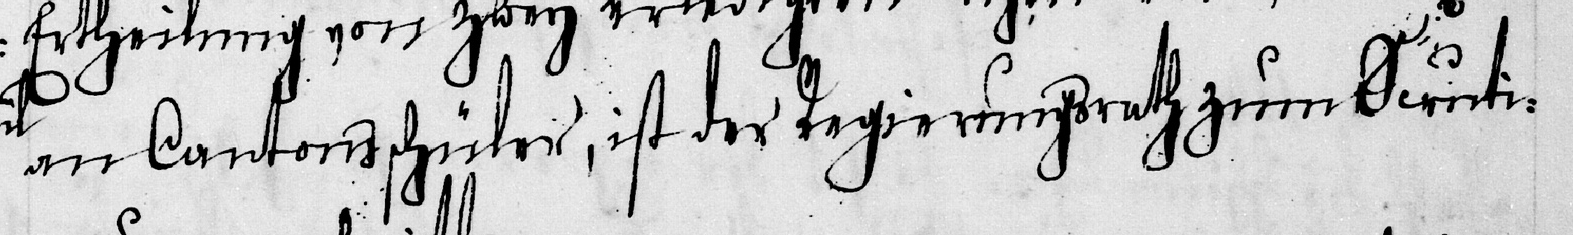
an Cantonsschüler, ist der Regierungsrath zum Scruti¬
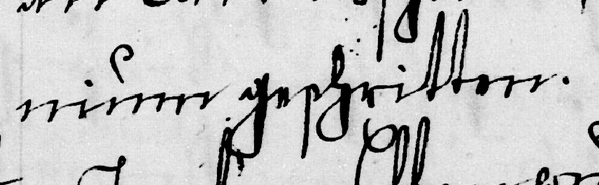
nium geschritten.
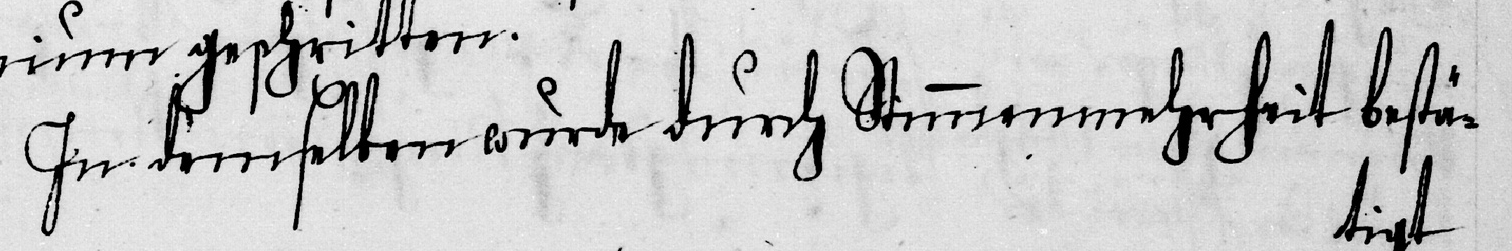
In demselben wurde durch Stimmenmehrheit bestä-
